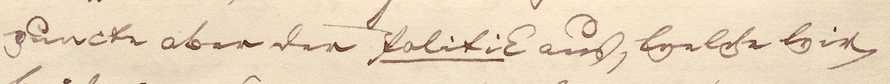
puncte aber der Politik aus, welche wir
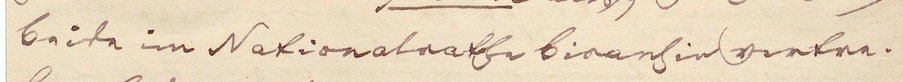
beide im Nationalrathe bisanhin vertre-
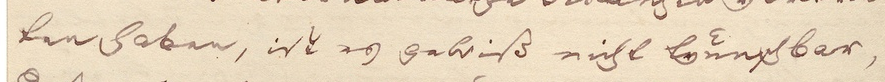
ten haben, ist es gewiß nicht wünschbar,
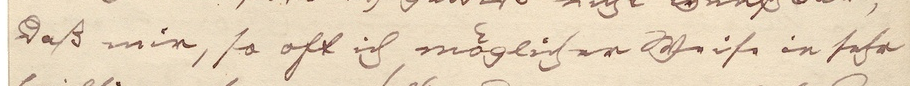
daß mir, so oft ich, möglicher Weise in sehr
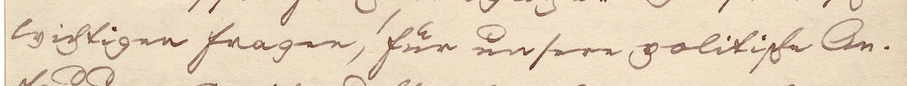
wichtigen Fragen, für unsere politische An-
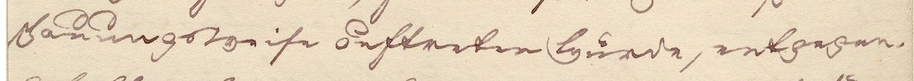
schauungsweise auftreten würde, entgegen-
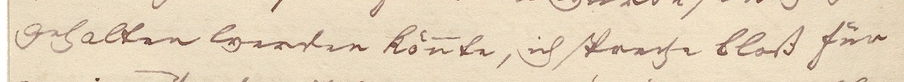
gehalten werden könnte, ich spreche bloß für
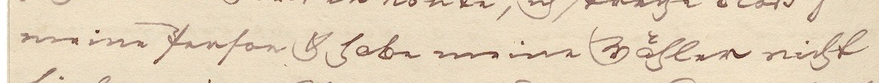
meine Person & habe meine Wähler nicht
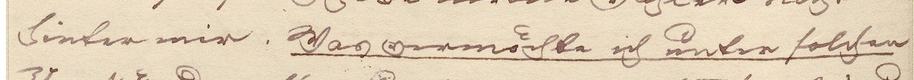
hinter mir. Was vermöchte ich unter solchen
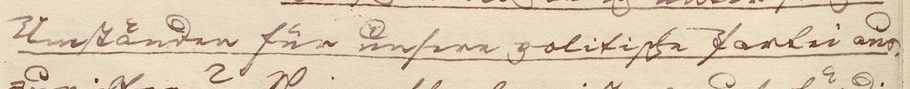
Umständen für unsere politische Partei aus-
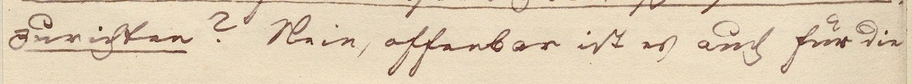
zurichten? Nein, offenbar ist es auch für die
